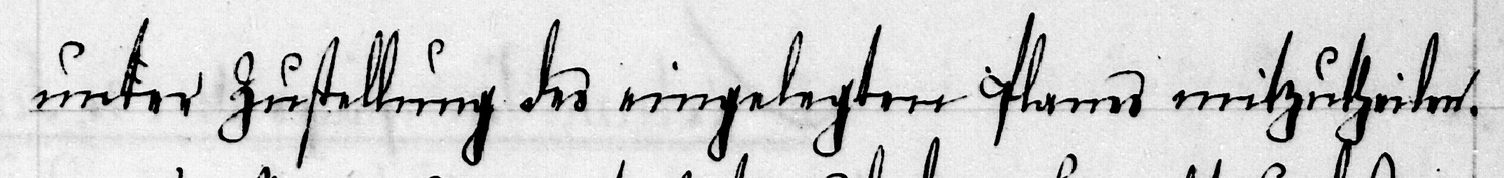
unter Zustellung des eingelegten Planes mitzutheilen.
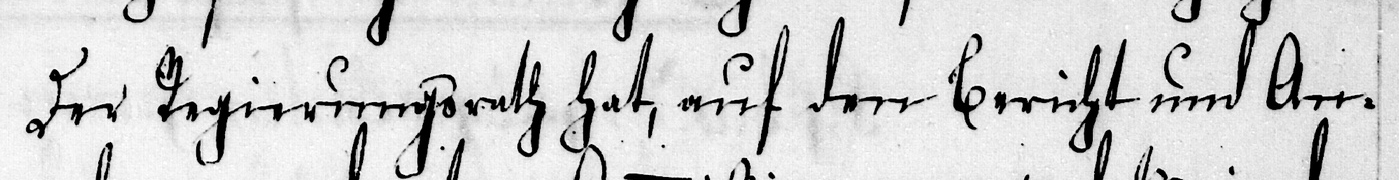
Der Regierungsrath hat, auf den Bericht und An¬
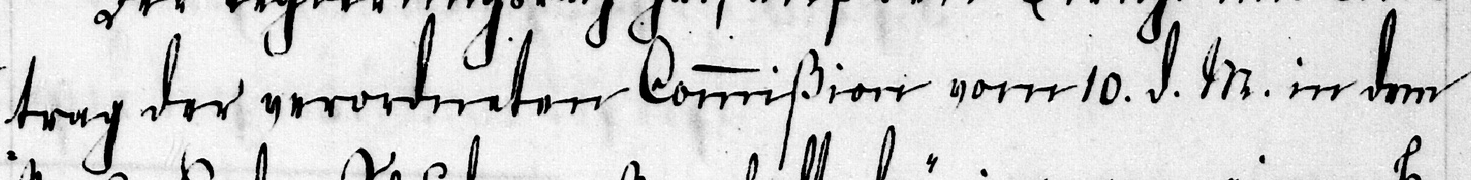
trag der verordneten Commißion vom 10. d. M. in dem
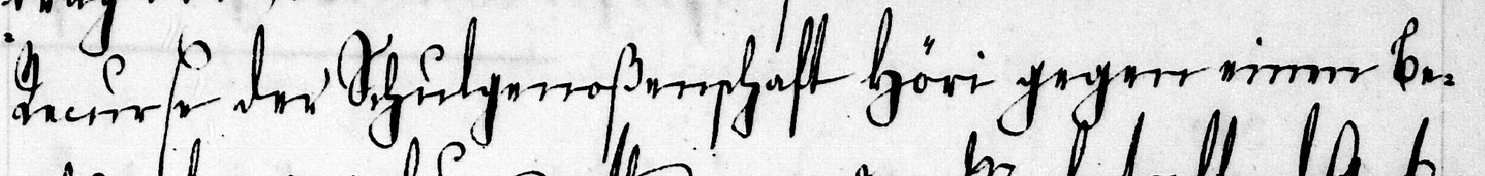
Recurse der Schulgenoßenschaft Höri gegen einen Bes¬
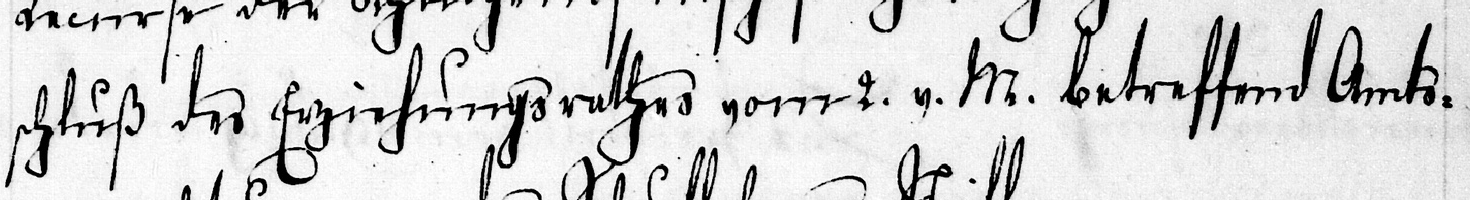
chluß des Erziehungsrathes vom 2. v. M. betreffend Amts¬
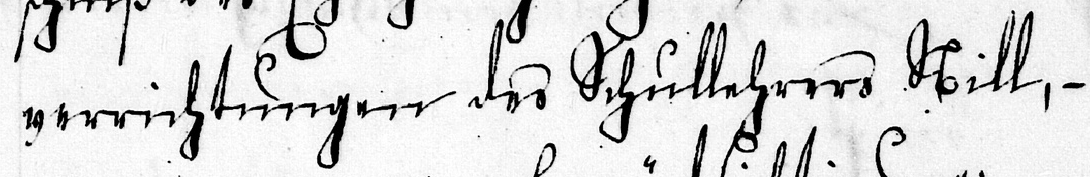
verrichtungen des Schullehrers Nill,
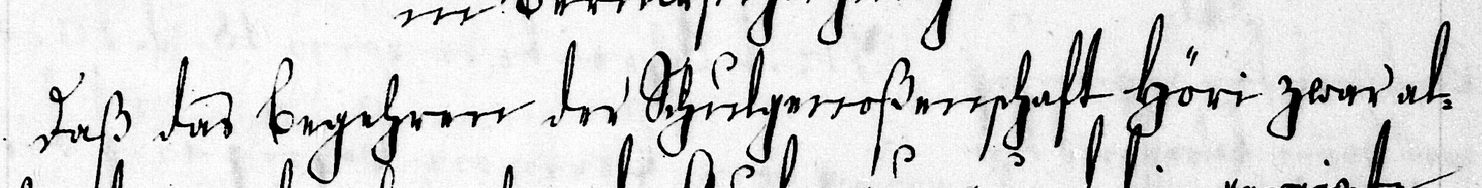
Daß das Begehren der Schulgenoßenschaft Höri zwar al¬
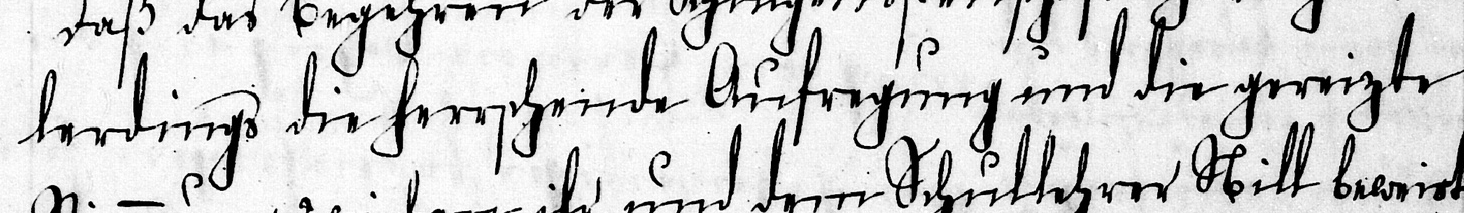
lerdings die herrschende Aufregung und die gereizte
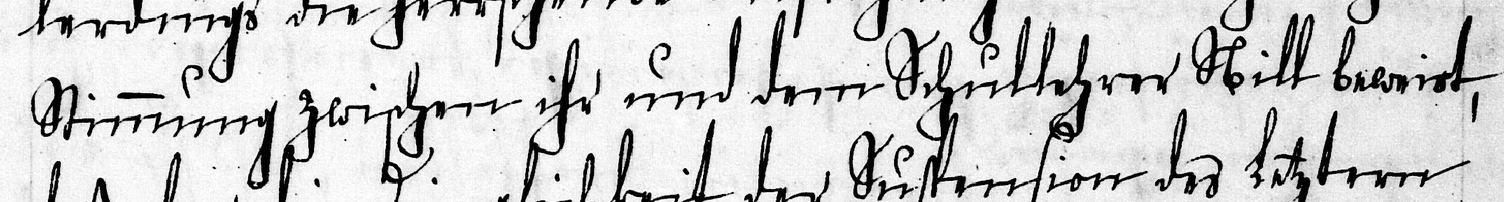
Stimmung zwischen ihr und dem Schullehrer Nill beweist,
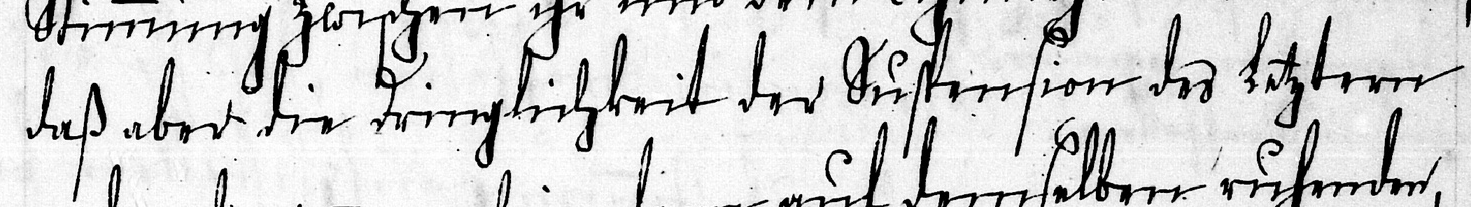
daß aber die Dringlichkeit der Suspension des Letztern
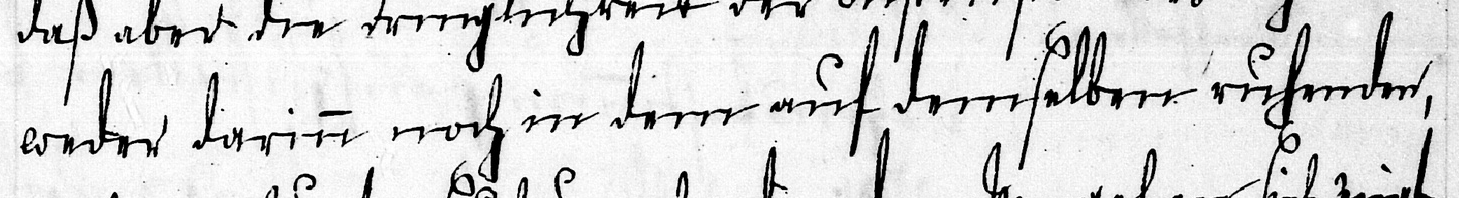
weder darin noch in dem auf demselben ruhenden,
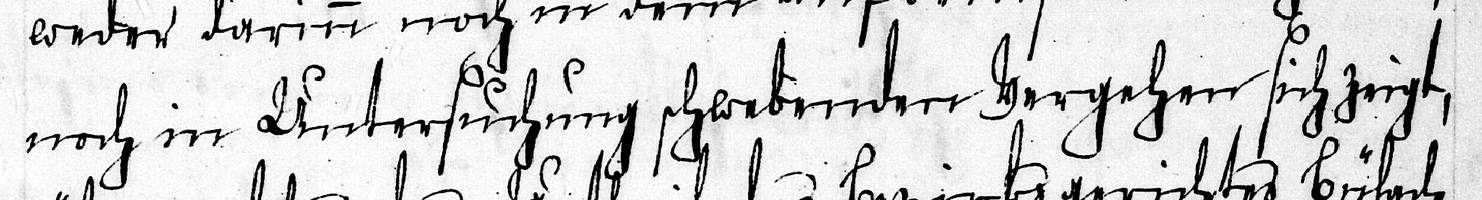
noch in Untersuchung schwebenden Vergehen sich zeigt,
